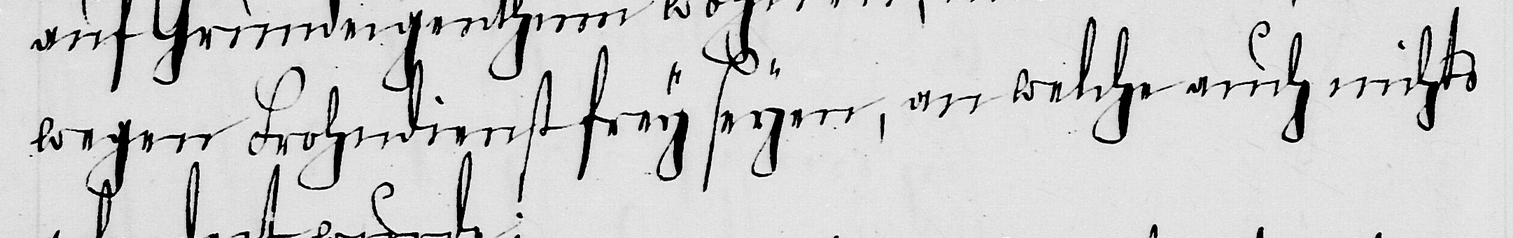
wegen Frohndienst frey seyen, an welche auch nichts
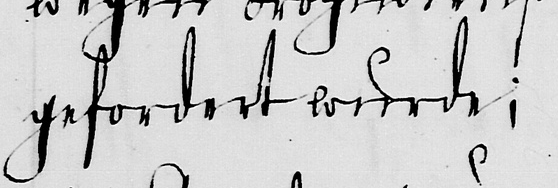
gefordert wurde;
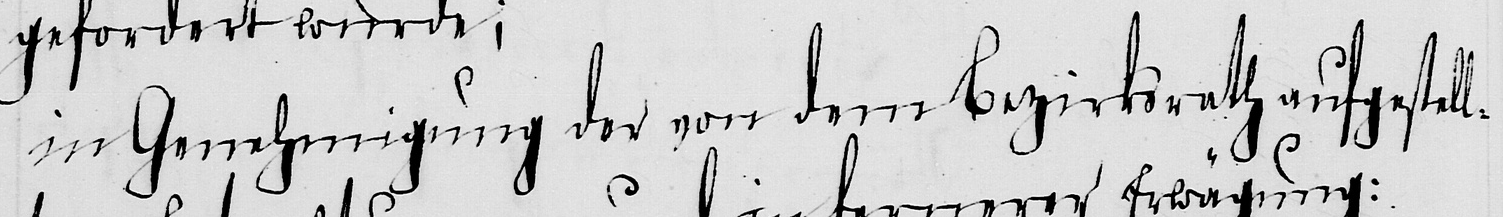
in Genehmigung der von dem Bezirksrath aufgestel¬
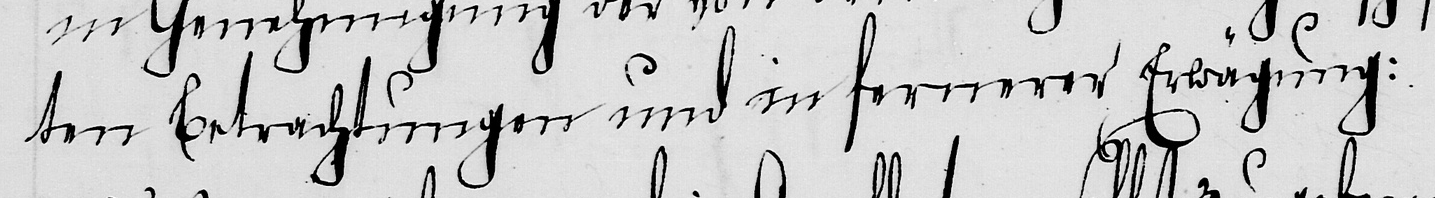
lten Betrachtungen und in fernerer Erwägung:
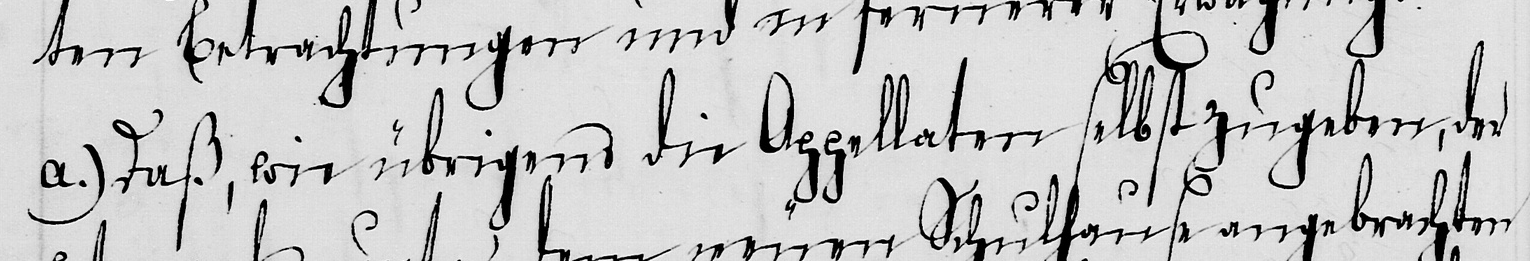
a.) Daß, wie übrigens die Appellaten selbst zugeben, der
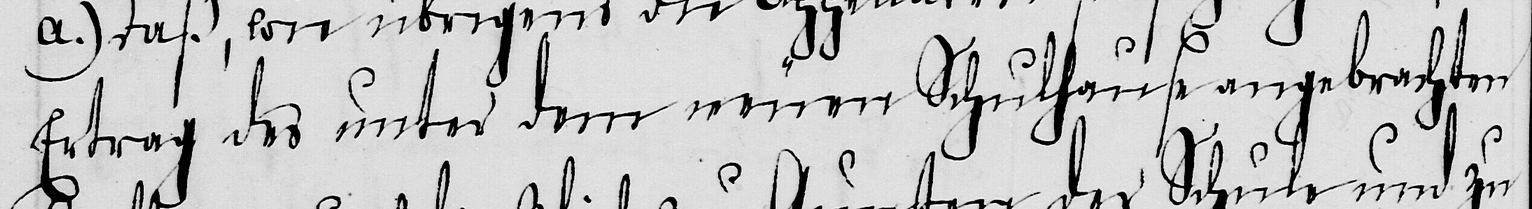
Ertrag des unter dem neuen Schulhause angebrachten
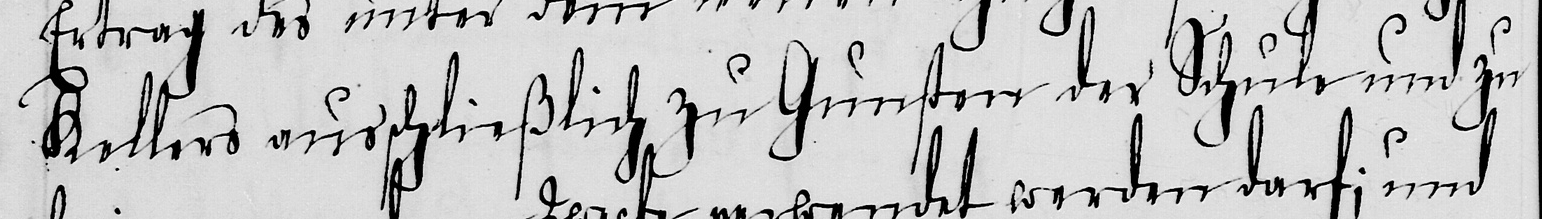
Kellers ausschließlich zu Gunsten der Schule und zu
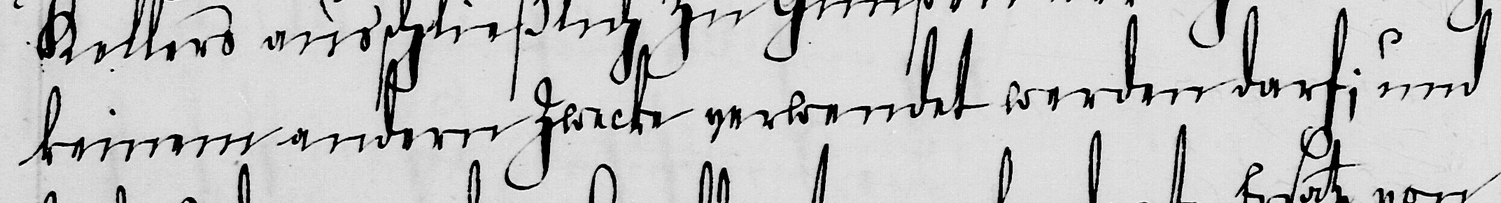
keinem andern Zwecke verwendet werden darf; und
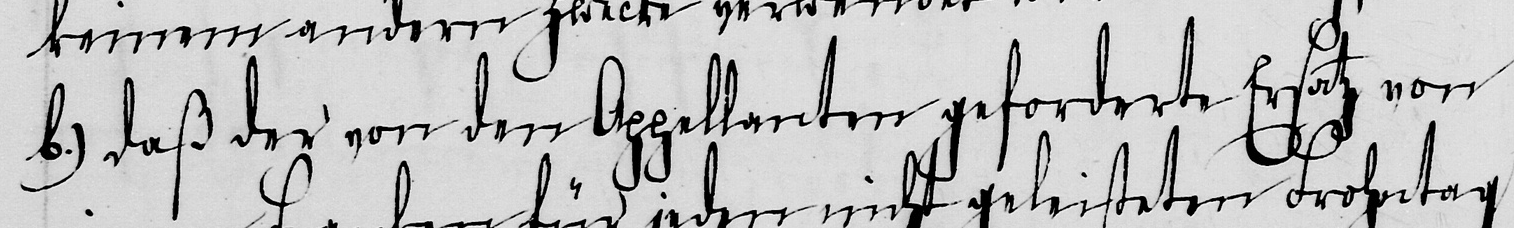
b.) daß der von den Appellanten geforderte Ersatz von
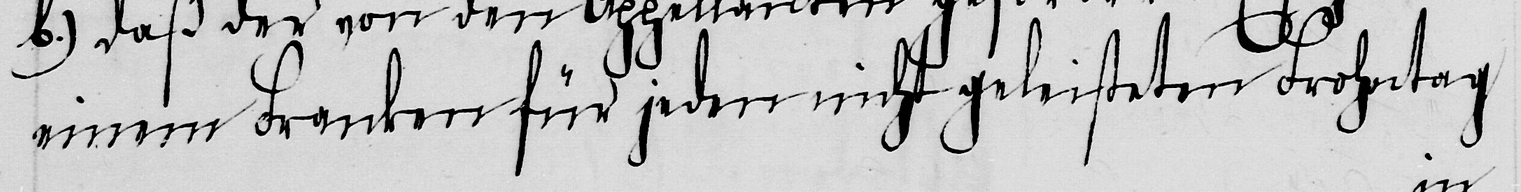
einem Franken für jeden nicht geleisteten Frohntag
